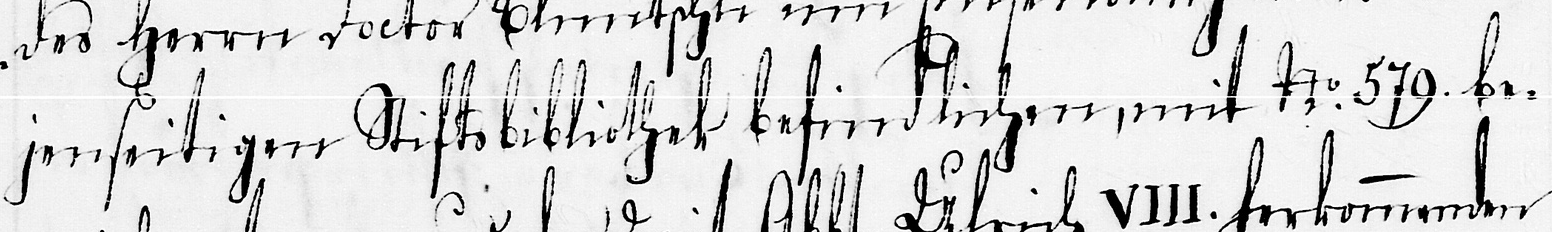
jenseitigen Stiftsbibliothek befindlichen, mit No. 579. be¬
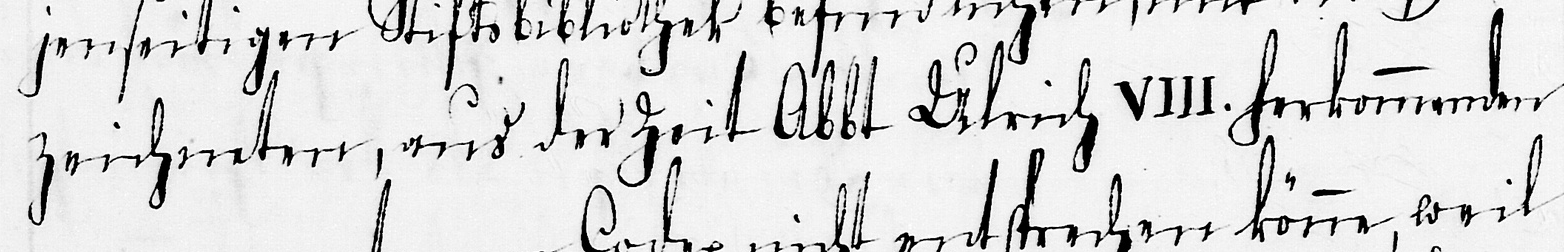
zeichneten, aus der Zeit Abbt Ulrich VIII. herkommenden
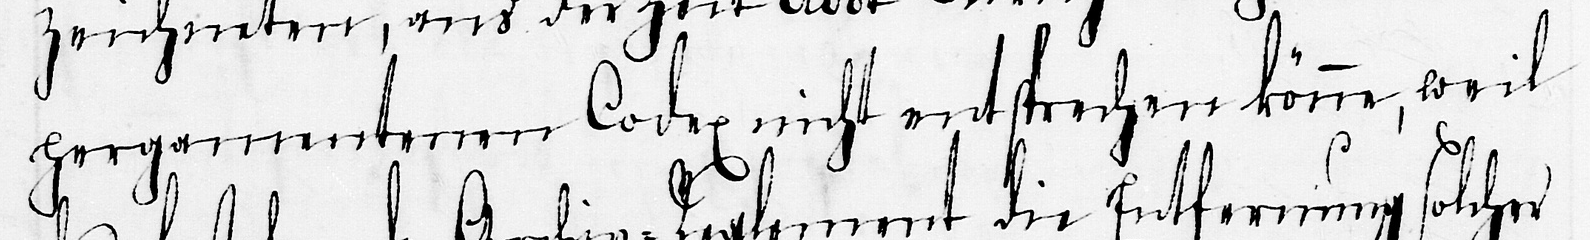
pergamentenen Codex nicht entsprechen könne, weil
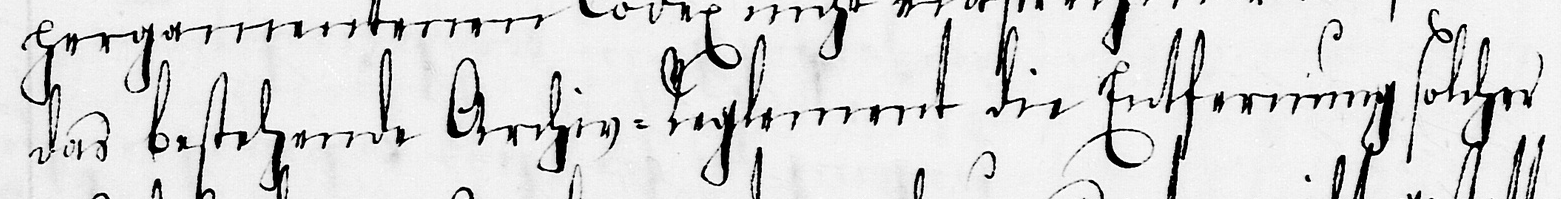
das bestehende Archiv-Reglement die Entfernung solcher
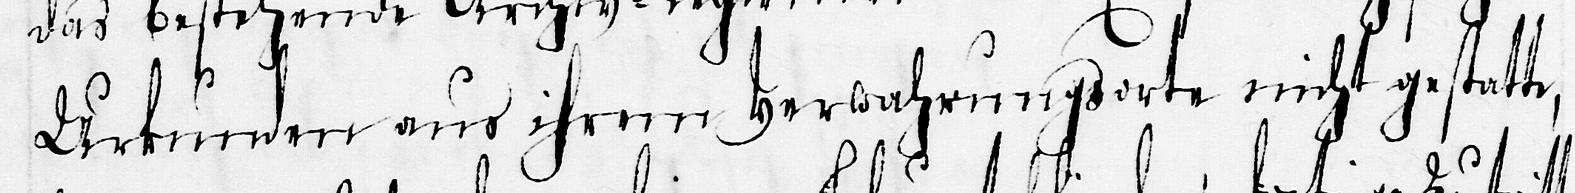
Urkunden aus ihrem Verwahrungsorte nicht gestatte,
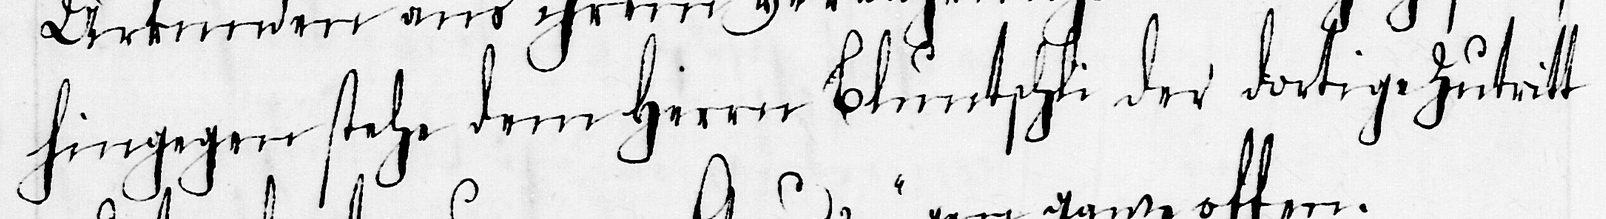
hingegen stehe dem Herrn Bluntschli der dortige Zutritt
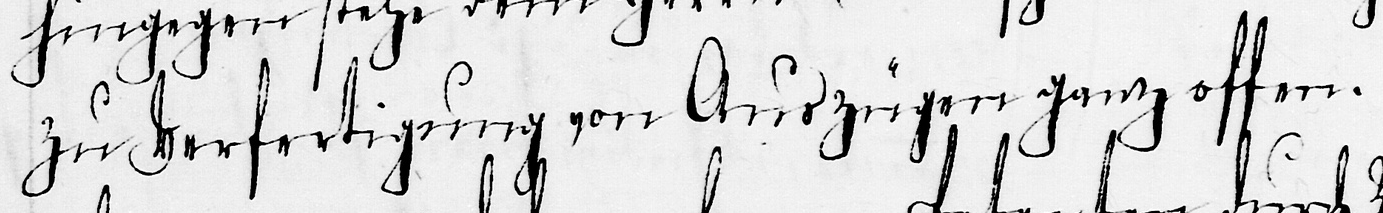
zu Verfertigung von Auszügen ganz offen.
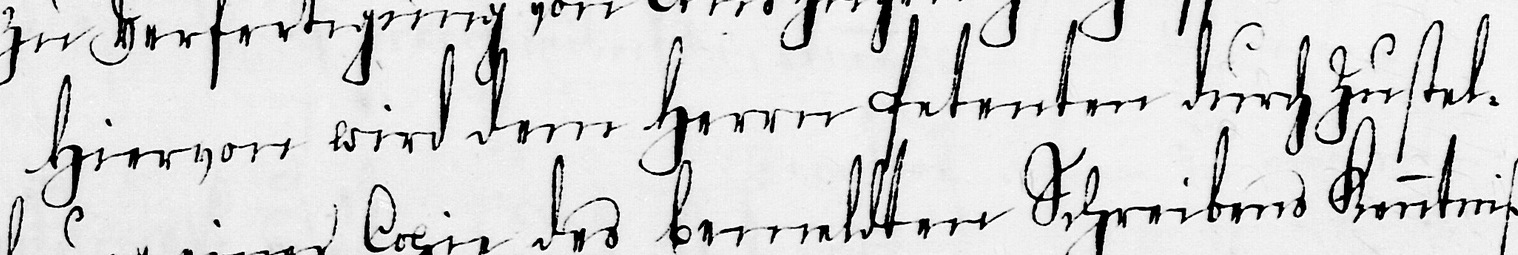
Hiervon wird dem Herrn Petenten durch Zustel¬
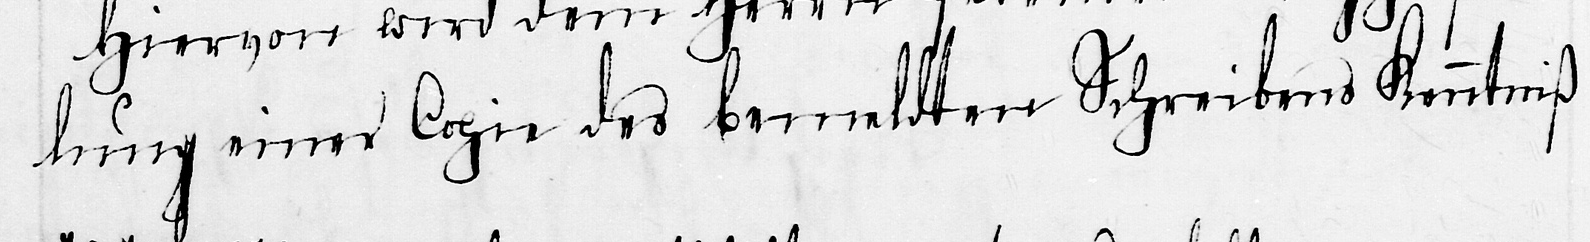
lung einer Copie des bemeldten Schreibens Kenntniß
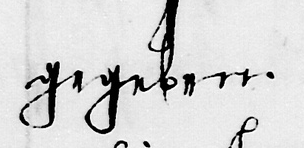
gegeben.
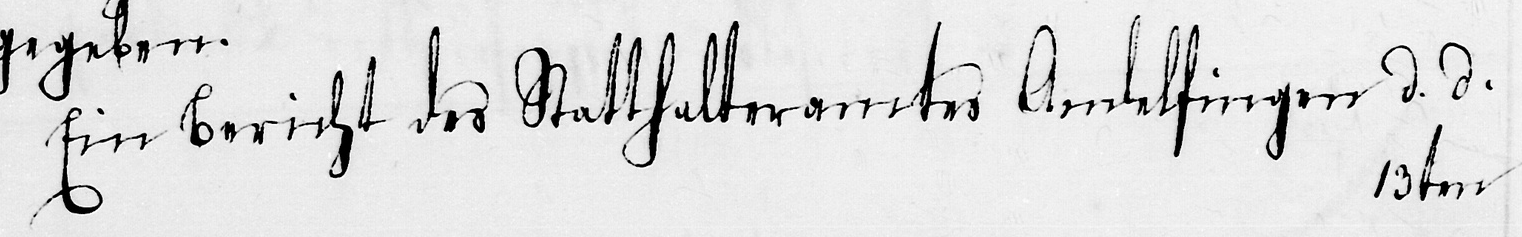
Ein Bericht des Statthalteramtes Andelfingen d. d.
